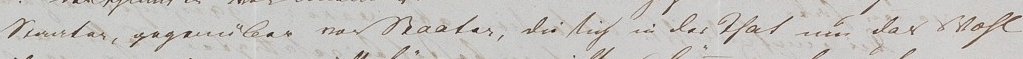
Staaten, gegenüber von Staaten, die sich in der That um das Wohl
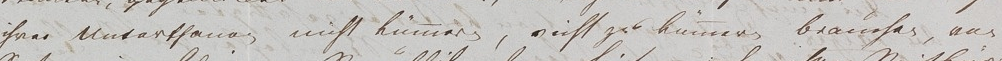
ihrer Unterthanen nicht kümmern, nicht zu kümmern brauchen, von
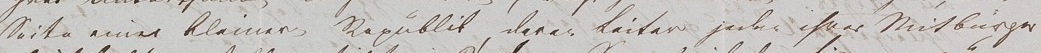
Seite einer kleinern Republik, deren Leiter jeden ihrer Mitbürger
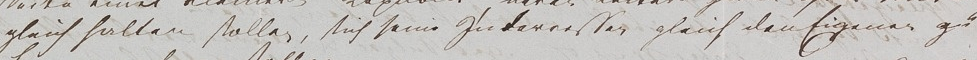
gleich halten sollen, sich seine Interessen gleich den Eigenen zu
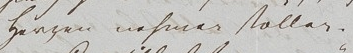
Herzen nehmen sollen.
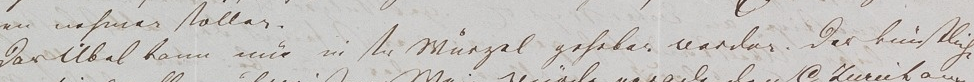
Das Übel kann nur in sr Wurzel gehoben werden. Der künstliche
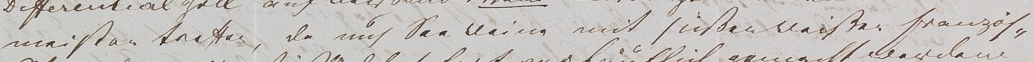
meisten treffen, da uns See weine mit süßen weißen Französ-
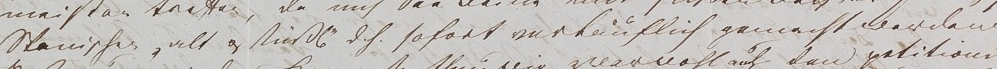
Spanischen «alt & süßl» d. h. sofort verkäuflich gemacht werden.
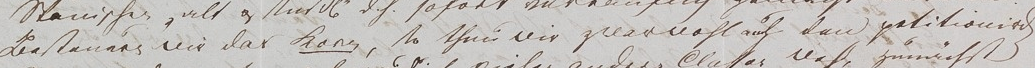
Besteuern wir das Korn, so thun wir zwar wohl auch den petitionirden
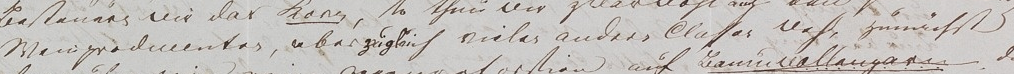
Weinproducenten, aber zugleich vielen andern Classen weh, zunächst
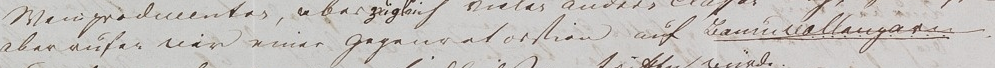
aber rufen wir einer Gegenretorsion auf Baumwollgarn, die
